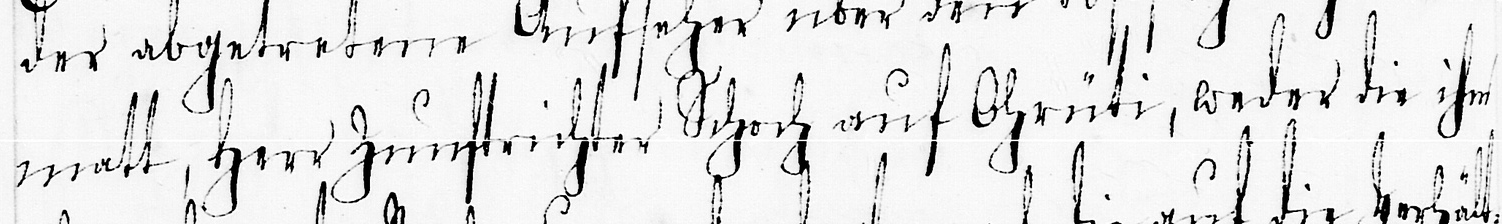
tmatt, Herr Zunftrichter Schoch auf Ohrüti, weder die ihm
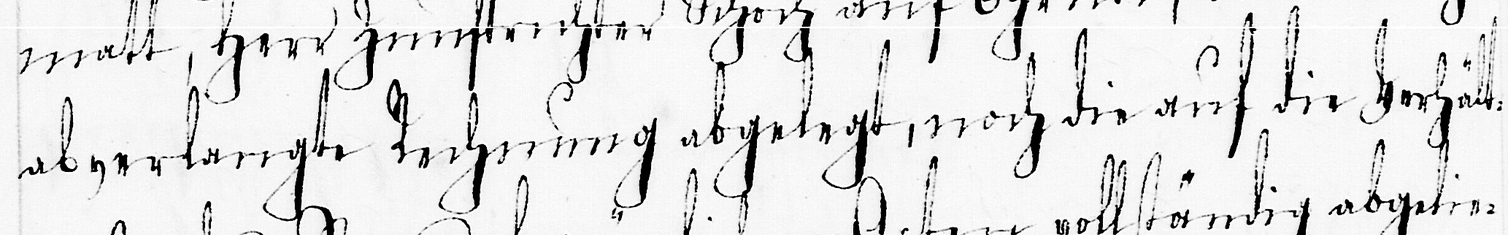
abverlangte Rechnung abgelegt, noch die auf die Verhäl¬
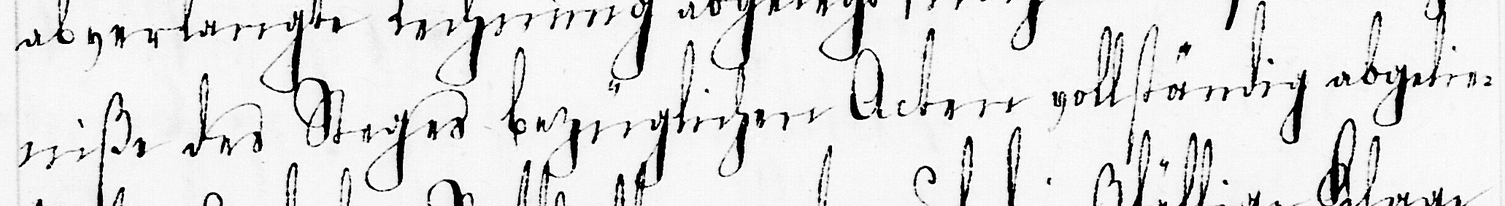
tniße des Steges bezüglichen Acten vollständig abgelie¬
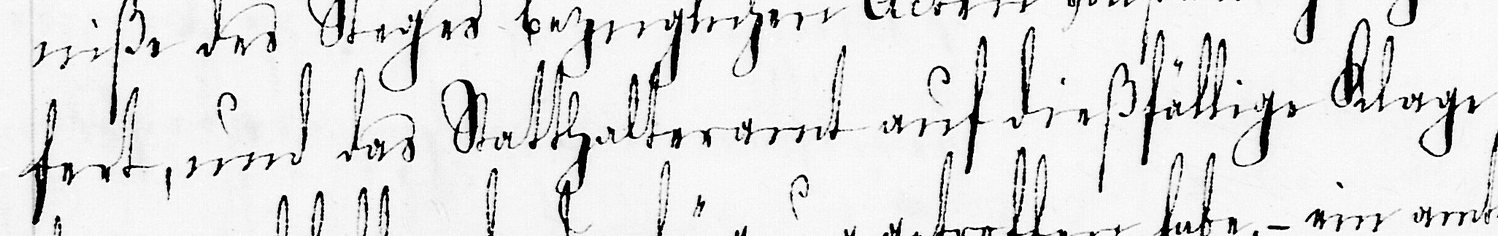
fert, und das Statthalteramt auf die dießfäl¬
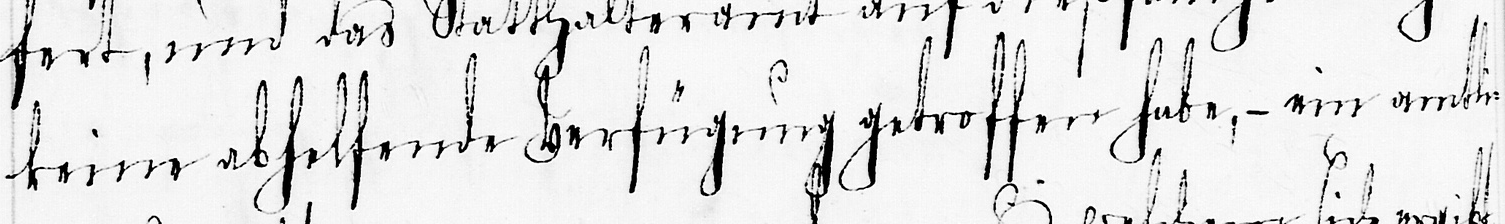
keine abhelfende Verfügung getroffen habe, – ein amt¬
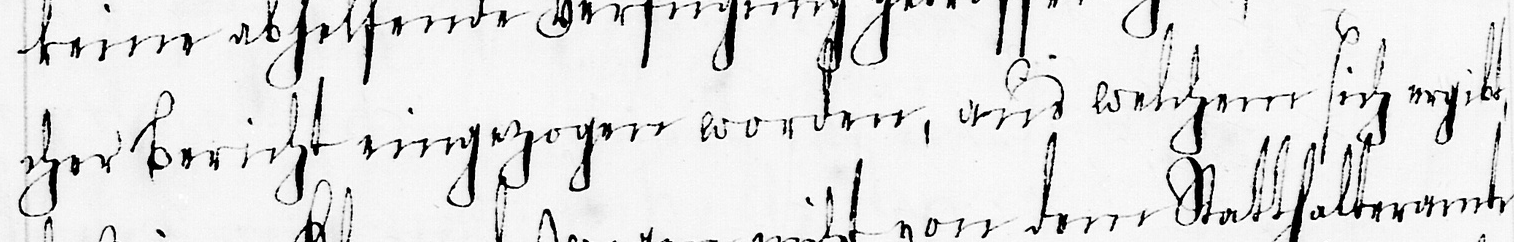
cher Bericht eingezogen worden, aus welchem sich ergibt,
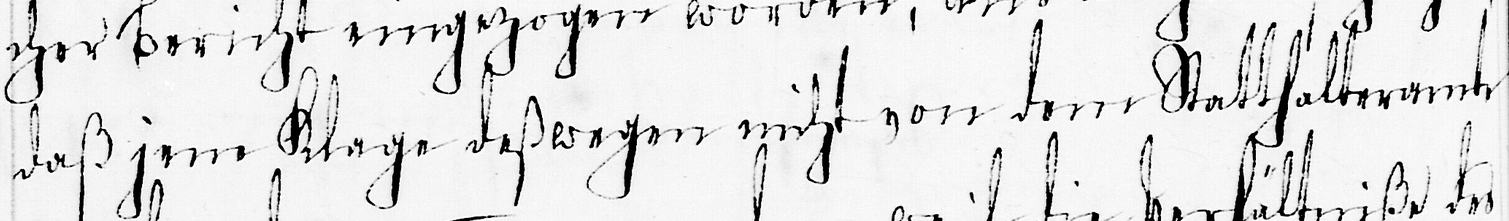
daß jene Klage deßwegen nicht von dem Statthalteramte
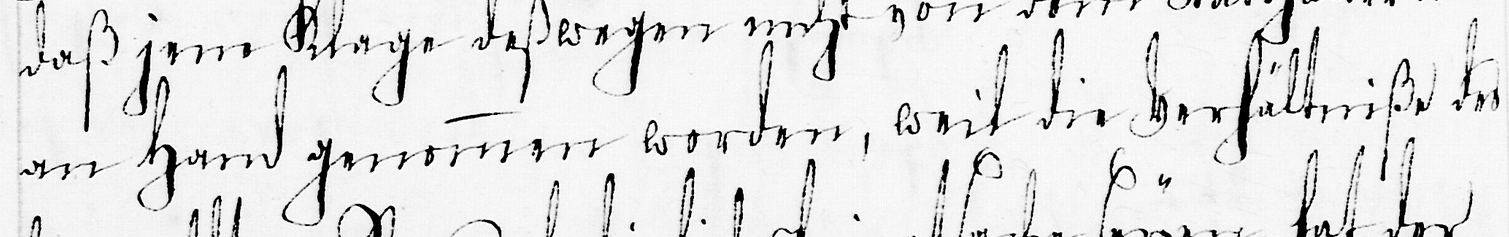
an Hand genommen worden, weil die Verhältniße des
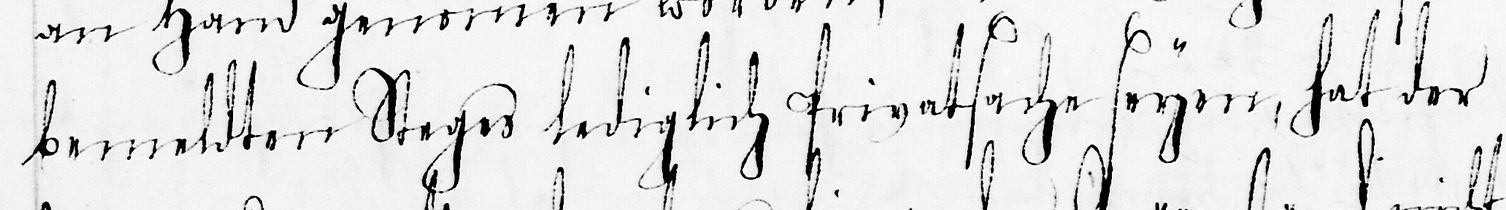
bemeldten Steges lediglich Privatsache seyen, hat der
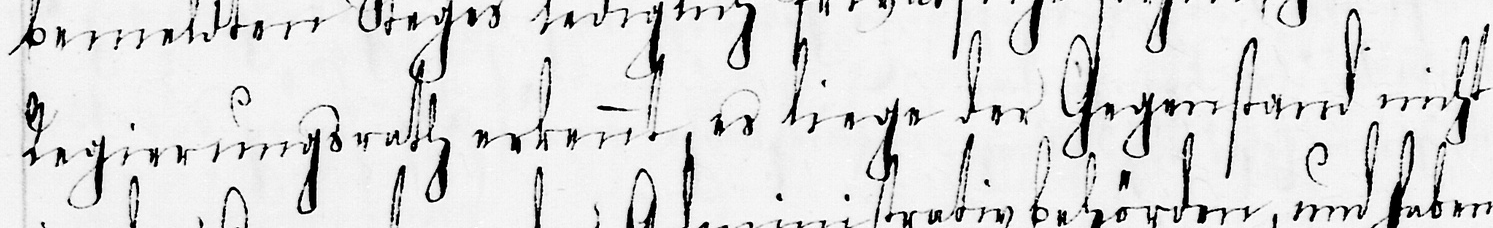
Regierungsrath erkennt, es liege der Gegenstand nicht
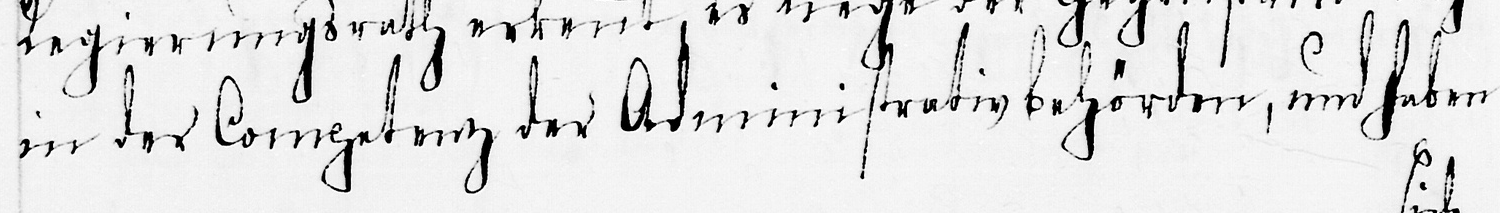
in der Competenz der Administrativbehörden, und haben
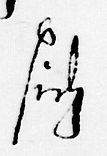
li¬
